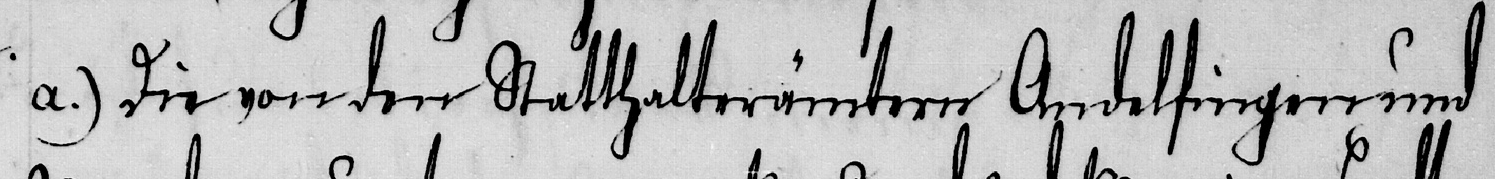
a.) Die von den Statthalterämtern Andelfingen und
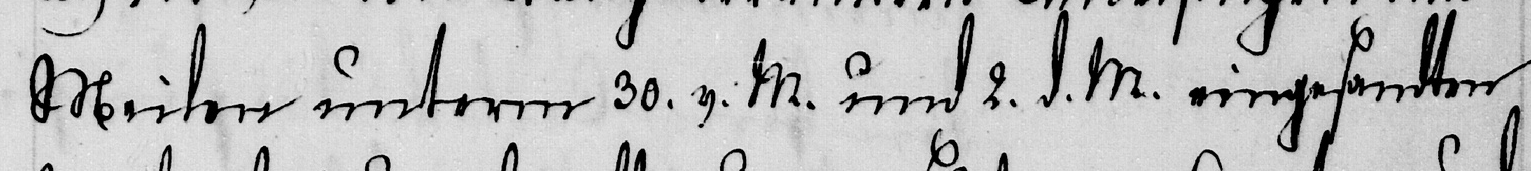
Meilen unterm 30. v. M. und 2. d. M. eingesandten
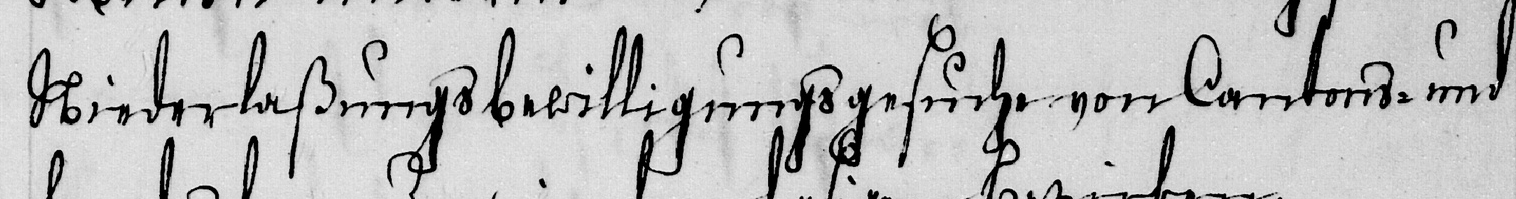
Niederlaßungsbewilligungsgesuche von Cantons- und
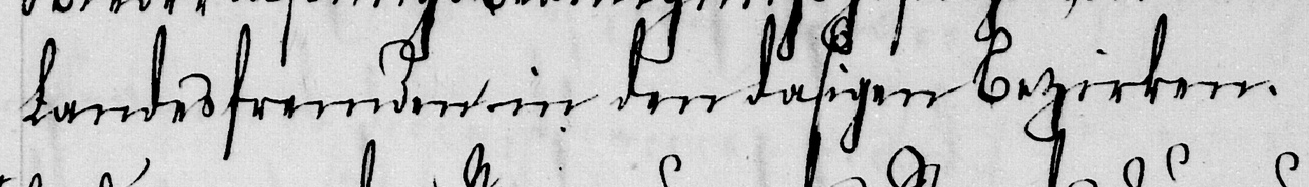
Landesfremden in den dasigen Bezirken.
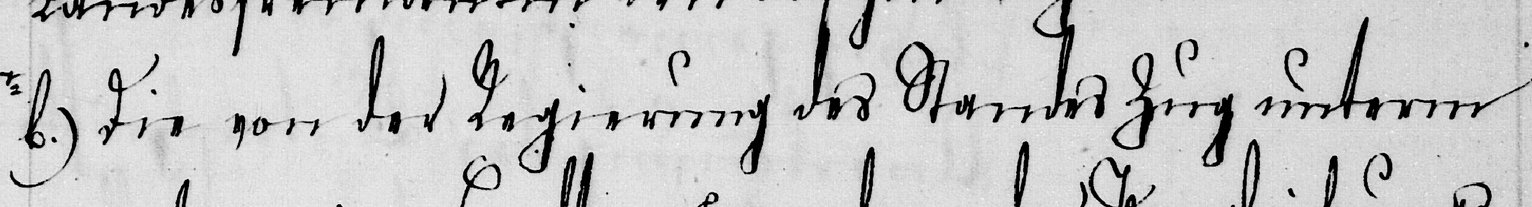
b.) Die von der Regierung des Standes Zug unterm
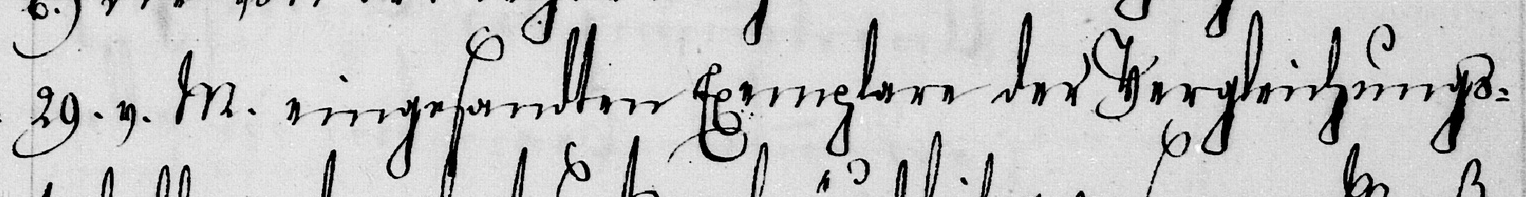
29. v. M. eingesandten Exemplare der Vergleichungs¬
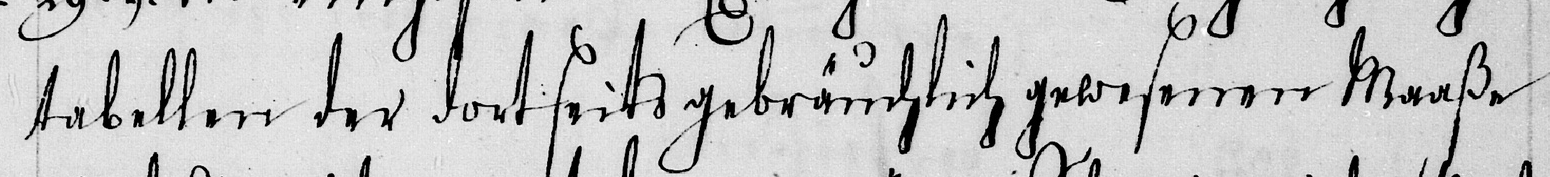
tabellen der dortseits gebräuchlich gewesenen Maaße
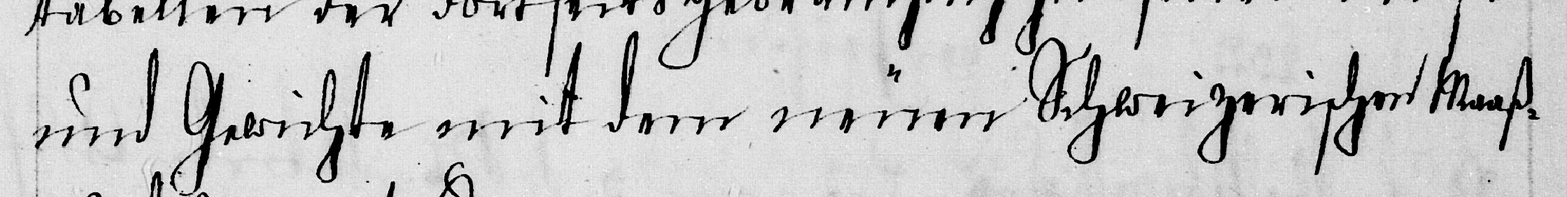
und Gewichte mit dem neuen Schweizerischen Maaß-
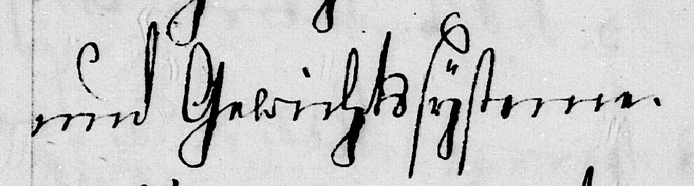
und Gewichtssysteme.
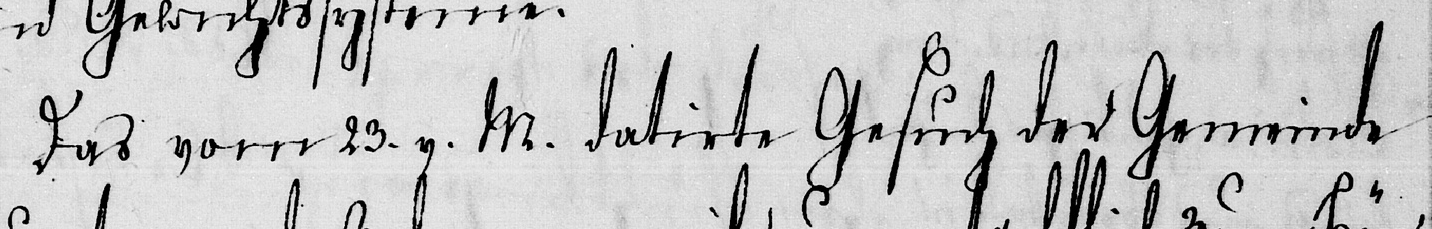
Das vom 23. v. M. datirte Gesuch der Gemeinde
